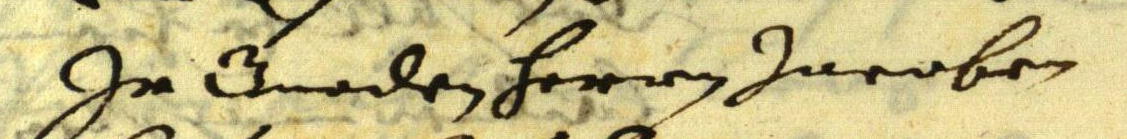Ir Gnaden herrn Jacoben
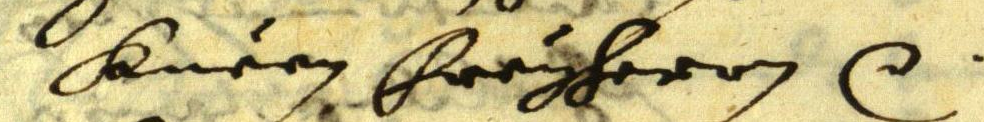Kūeen Freȳherrn etc.
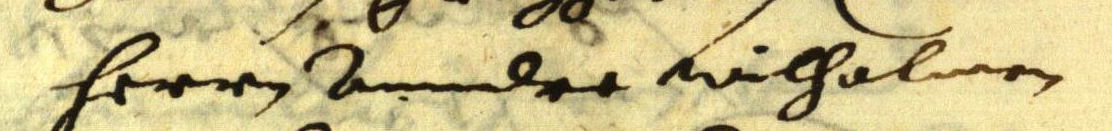herrn Anndre Wilhalmen
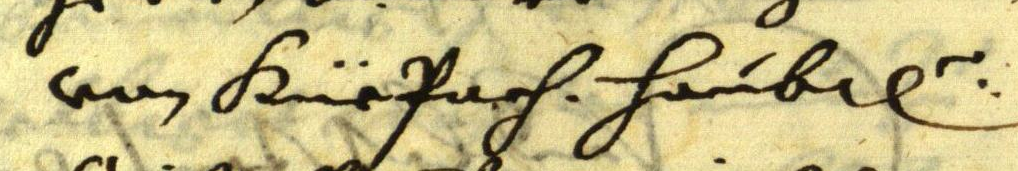von KüePach haūbt:
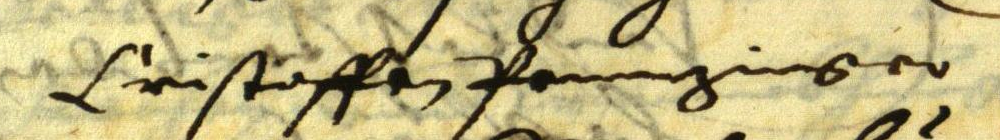Cristoffen Pennzinger
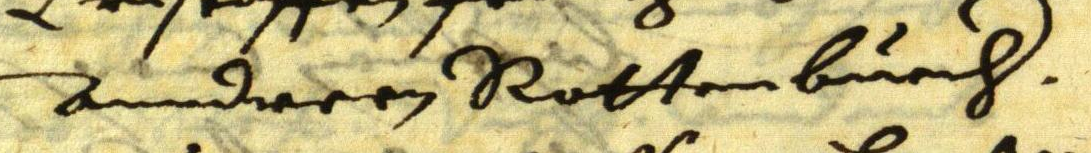Anndreen Rottenbūech.
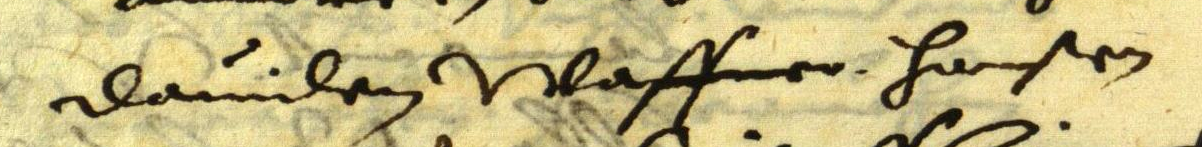Daūiden Waffner. hansen
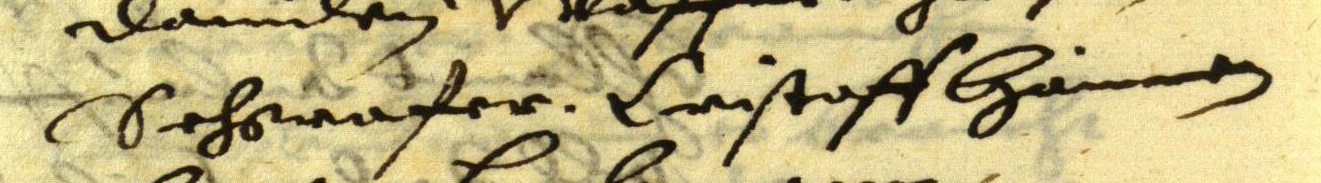Schgrafer. Cristoff Haimen
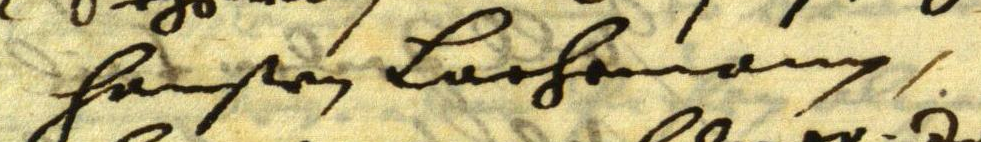hansen Lochemann,
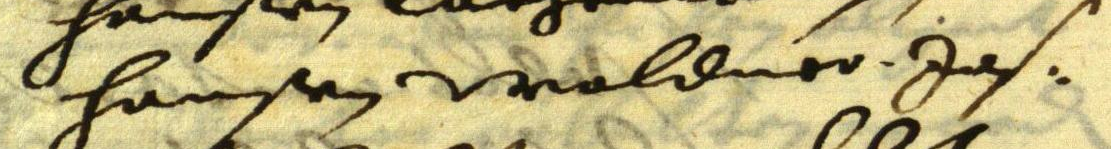hansen Waldner. Jos-
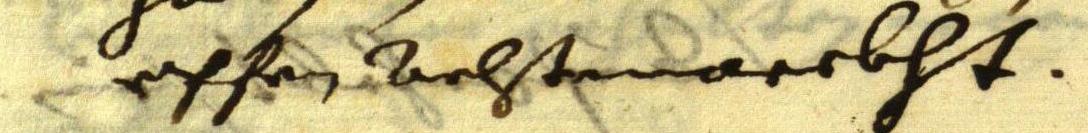effen Achtmarckht.
